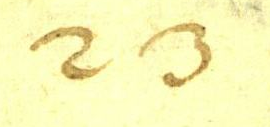23
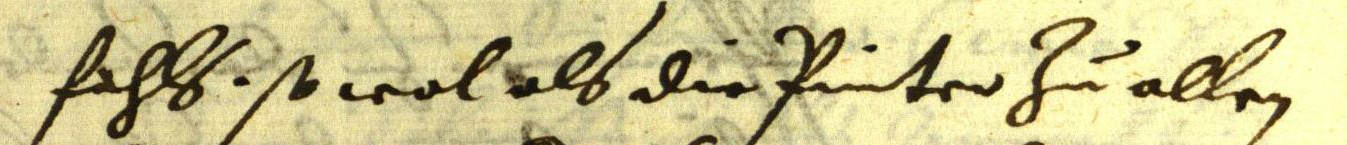fahls. so wol als die Pinter Zū allen
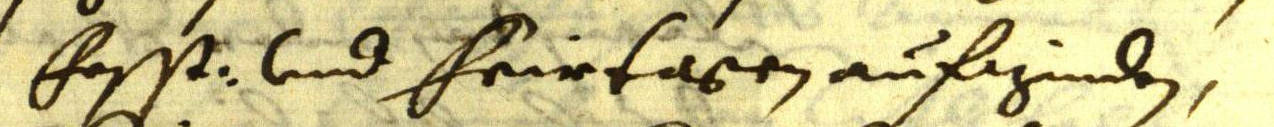Fesst: vnd Feirtagen aūfzinden,
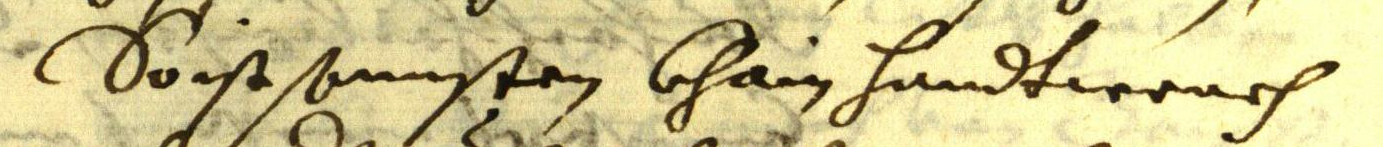So ist sonnsten khain Handtwerch
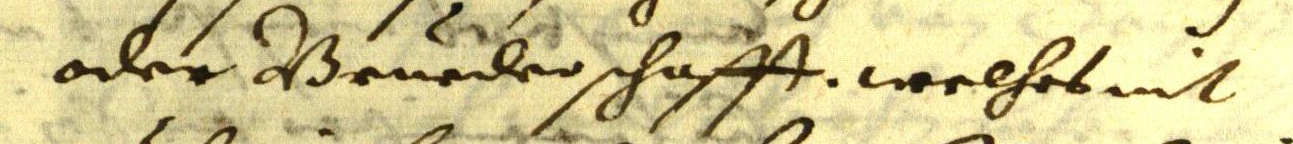oder Brūederschafft. welhes nit
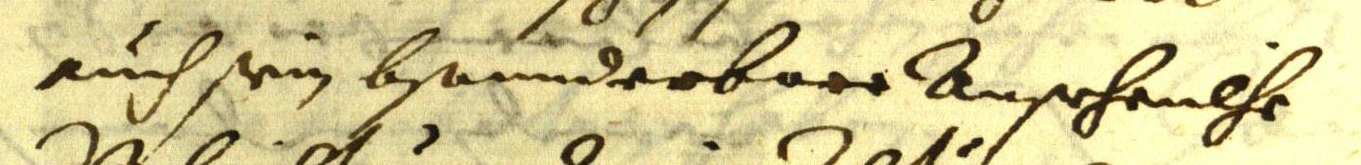aūch sein besonnderbare Ansehenlihe
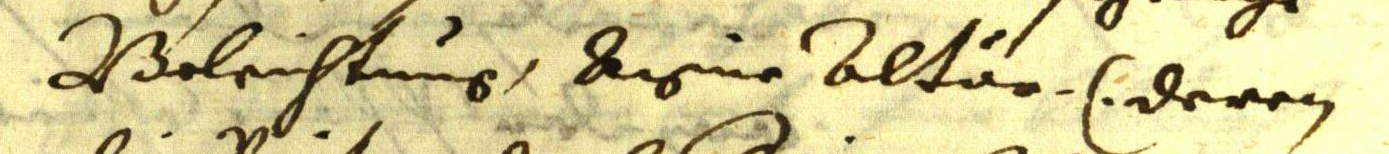Beleichtūng, Aigne Altār .(.deren
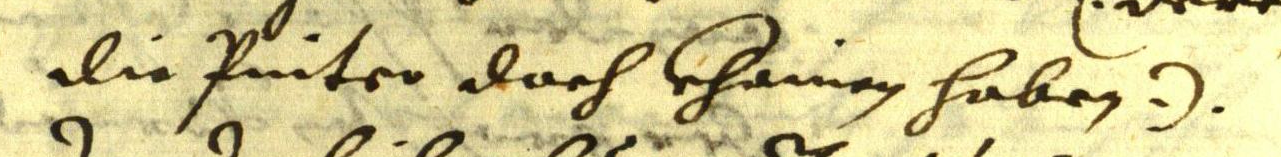die Pinter doch khainen haben.).
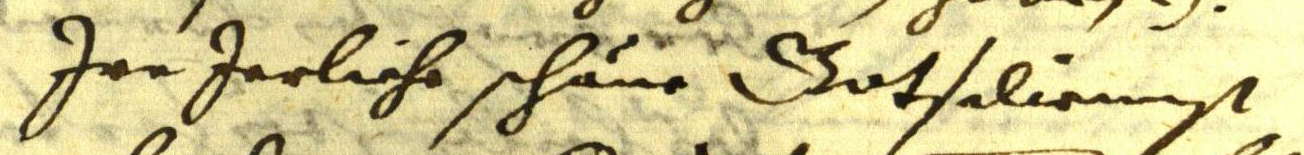Ire Jerliche schōne Gotsdienst
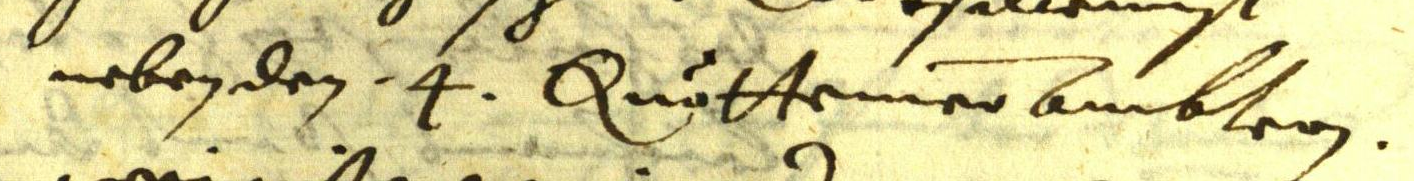neben den .4. Qūattemer Ambter.
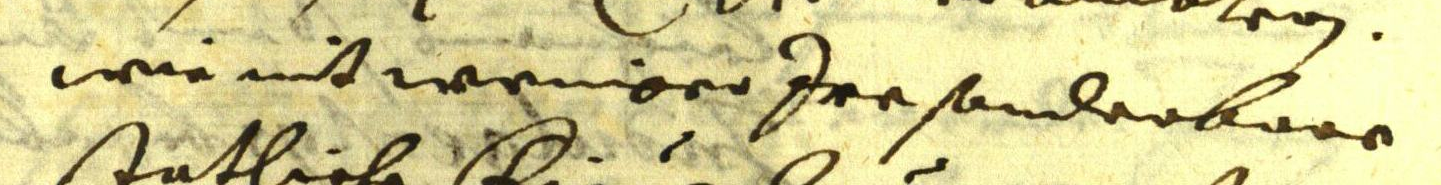wie mit wenigen Ire sonderbare
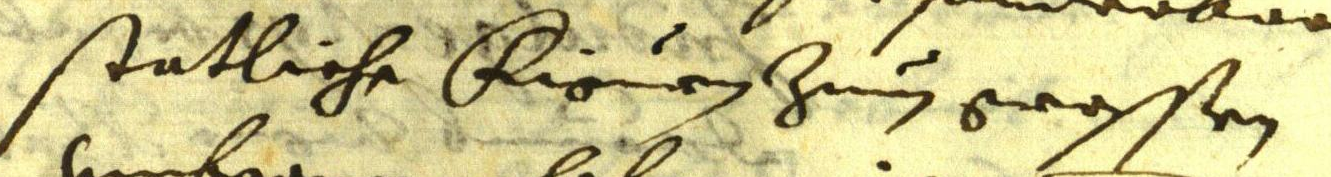statliche Figūren Zūm grossen
